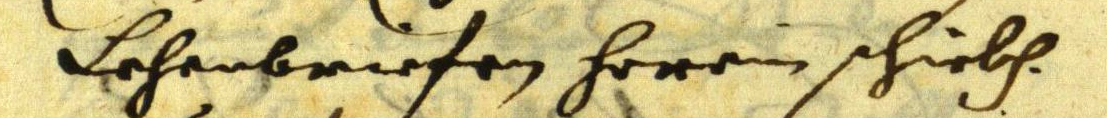Lehenbriefen herein schickh.
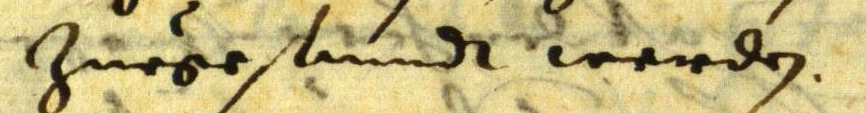Zūegesanndt werden.
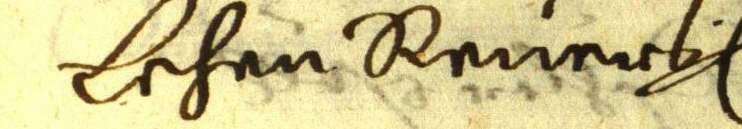Lehen Reūers.
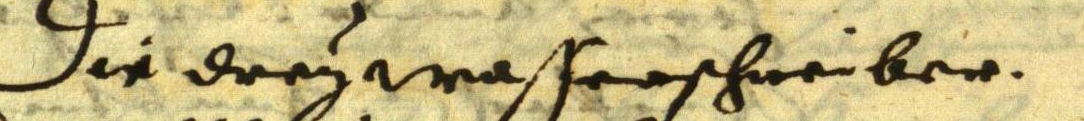Die dreȳ wasserschreiber.
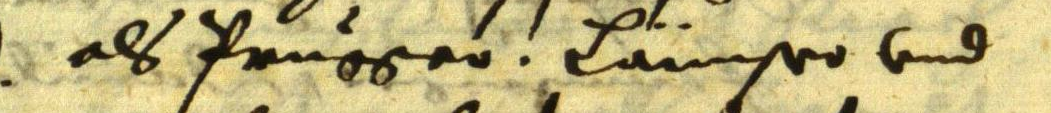als Prūgger. Lännser vnd
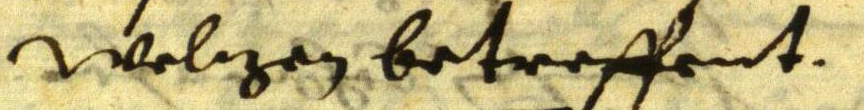Welzen betreffent.
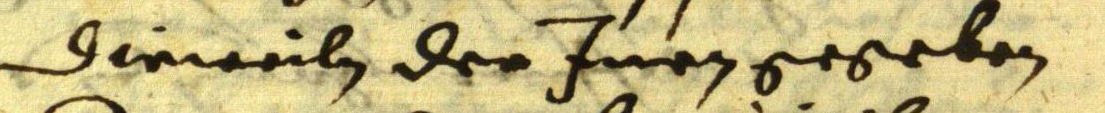Dieweiln der Inen gegeben
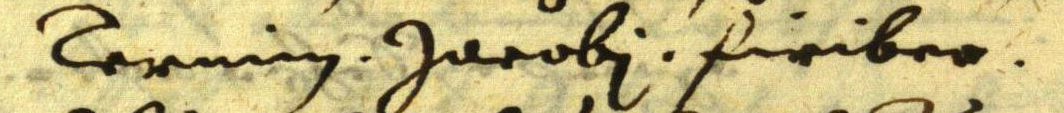Termin. Jacobj. firiber.
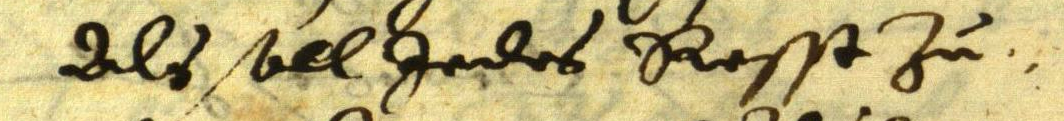Als soll Jedes Resst Zū¬
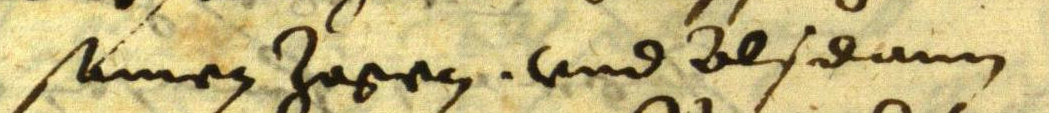samen Zogen. vnd Alsdann
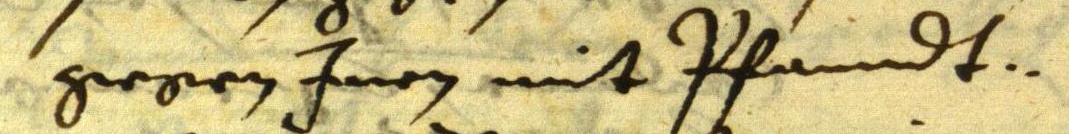gegen Inen mit Pfanndt¬
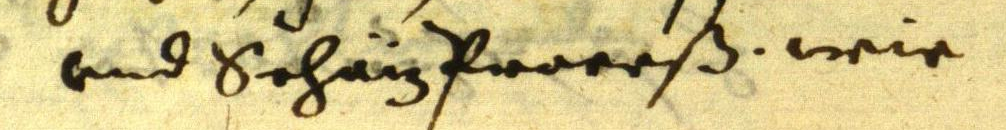vnd Schäz Proceß. wie
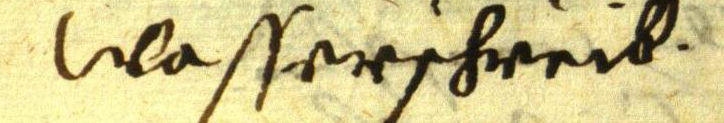Wasserschreib.
